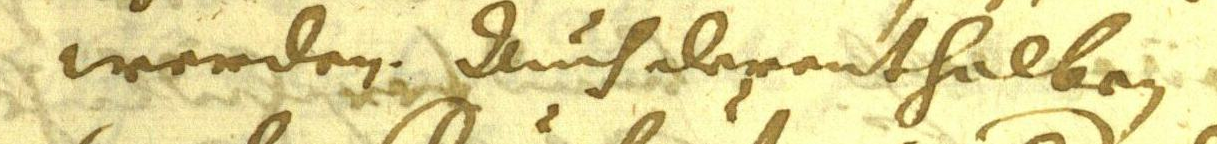werden. Aūch derenthalben
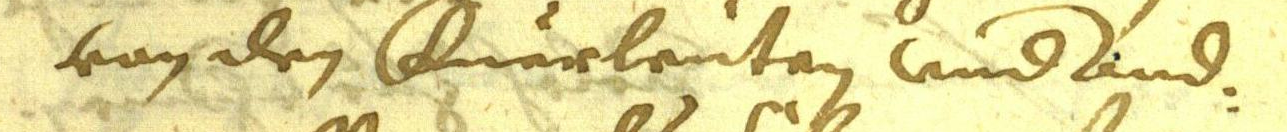von den Fūerleūten vnd And¬
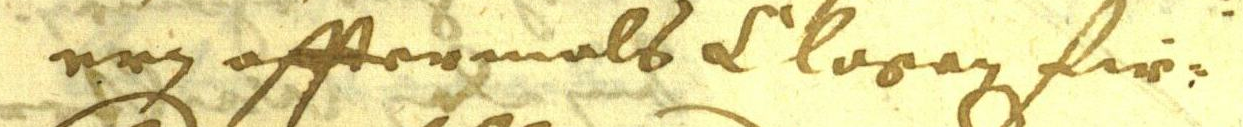ern offtermals Clagen fir¬
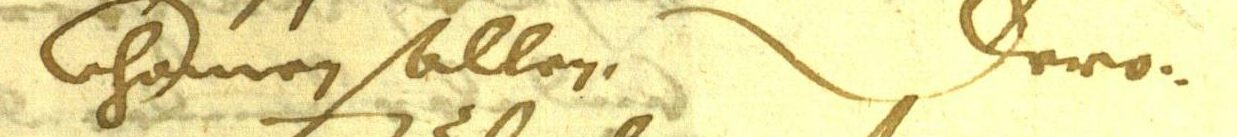khomen sollen. Dero¬
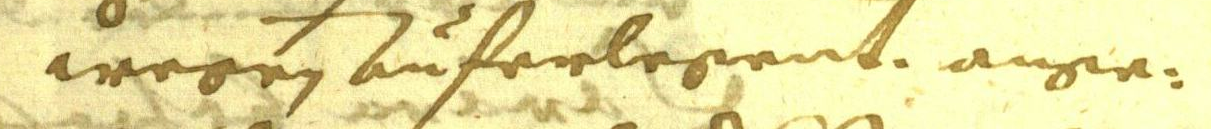wegen Aūferlegent. ange¬
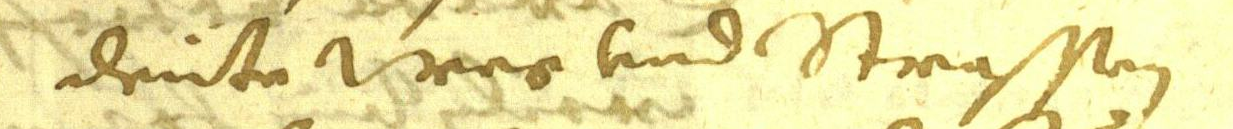deite Weg vnd Strassen
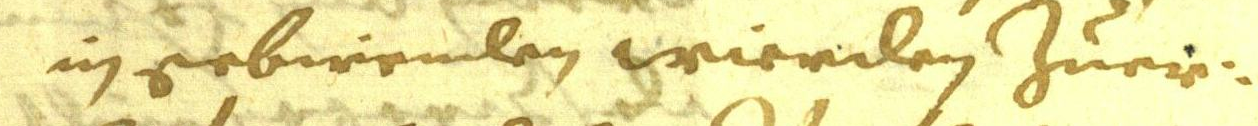in gebirenden wierden Zūer¬
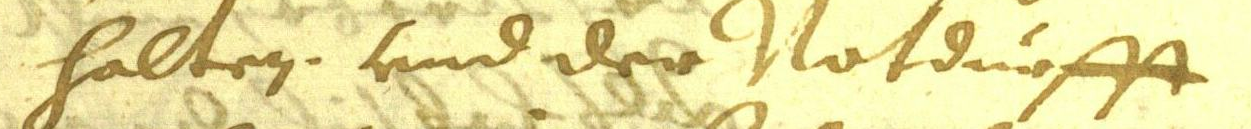halten. vnd der Notdūrfft
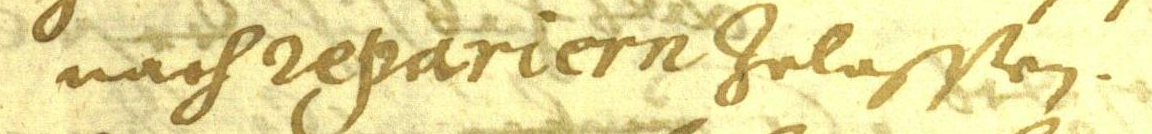nach repariern Zelassen.
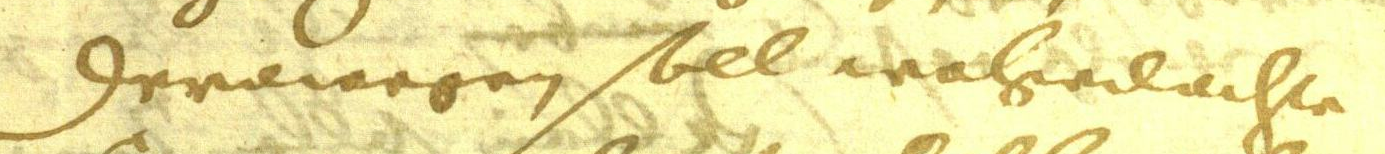Derowegen soll wolgedachte
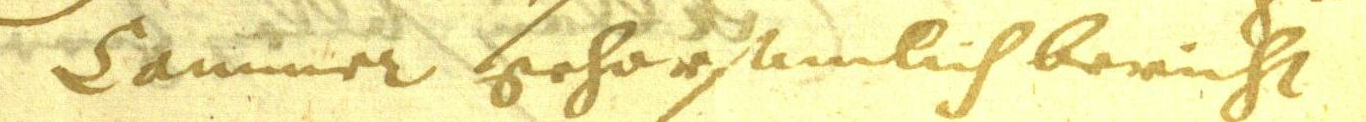Cammer gehorsamlich bericht
